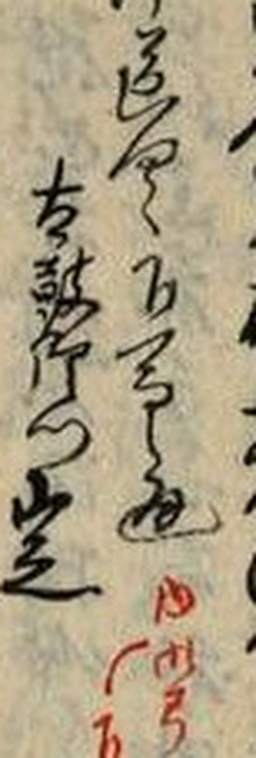太鼓御門定
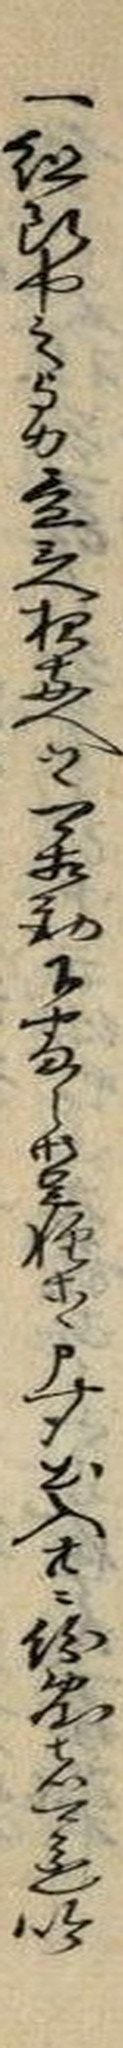一組頭中之与力昼三人夜両人ツヽ可相勤下番之御足軽等へ申聞出入共ニ紛敷者可遂吟
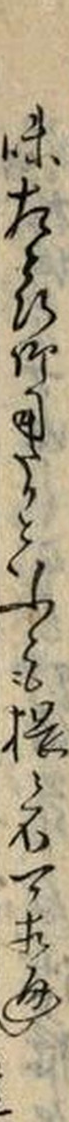味たとひ御用たりといふとも猥ニ不可相通
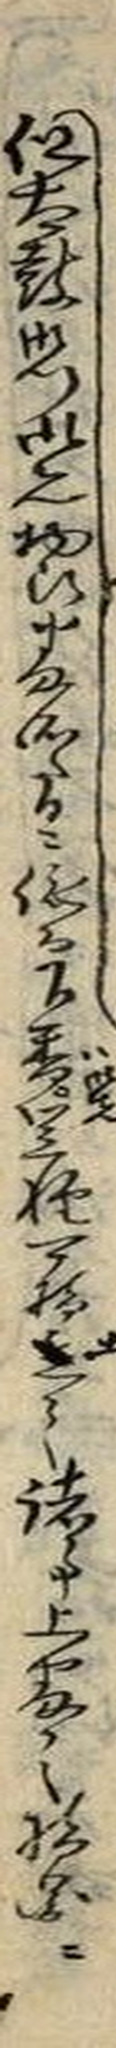但太鼓御門御先物頭番所たるニ依而下番ハ御先足軽可指出之諸事上番之指図ニ
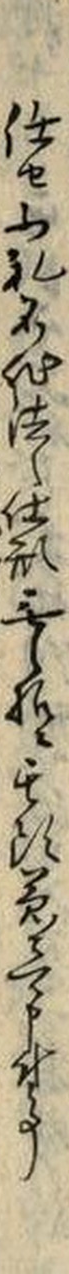任セ不礼不作法之仕形無之様ニ其段兼々可申付候事
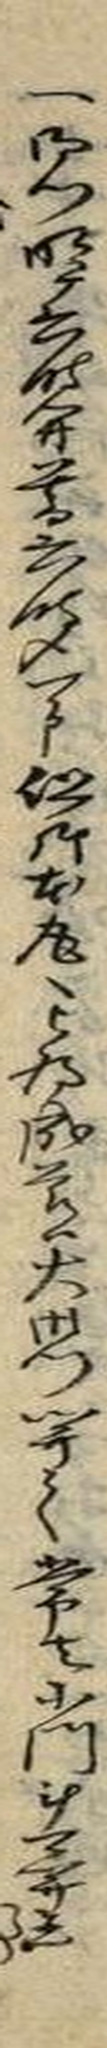一御門明ケ六時開暮六時〆可申但御本丸へ被為成節ハ大御門開之常者小門斗可開置事
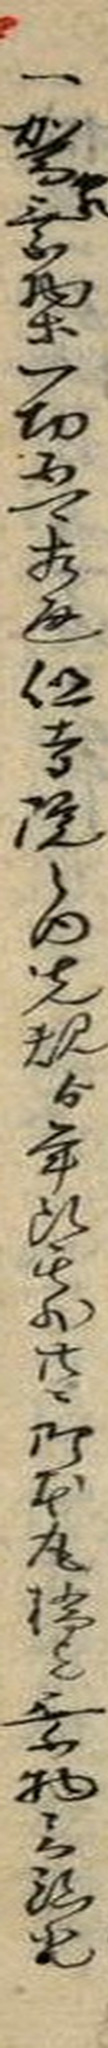一駕籠乗物等一切不可相通但寺院之内先規ゟ年頭其外共ニ御本丸橋迄乗物ニ而致登

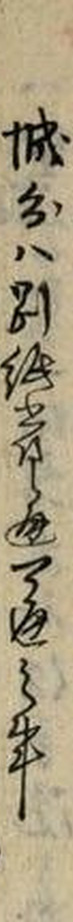城分ハ別紙書付之通可通之事
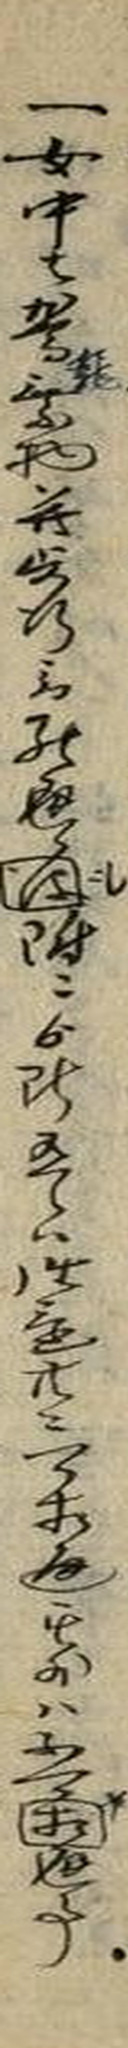一女中は駕籠乗物并歩行ニ而罷通候も附々ゟ断有之ハ往還共ニ可相通其外ハ不可通事
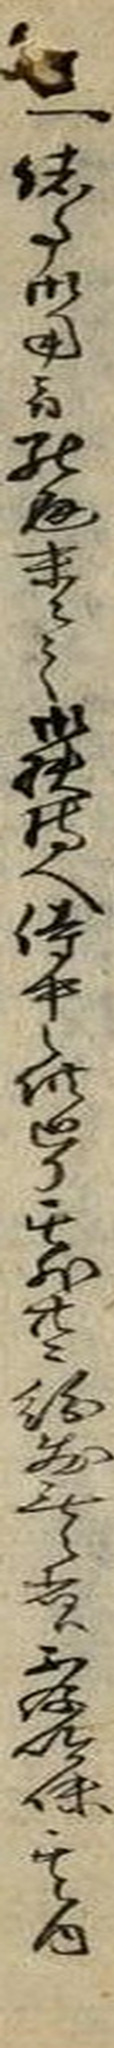一諸事御用ニ付罷通末々之御扶持人侍中之供廻り其外共ニ紛敷無之物者ハ不及吟味其内
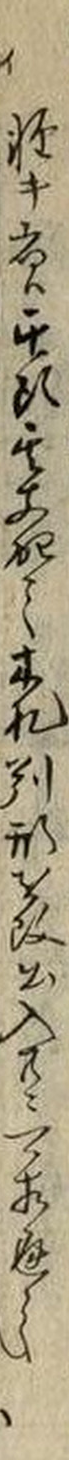軽キ者ハ其頭其支配之木札判形を改出入共ニ可相通之
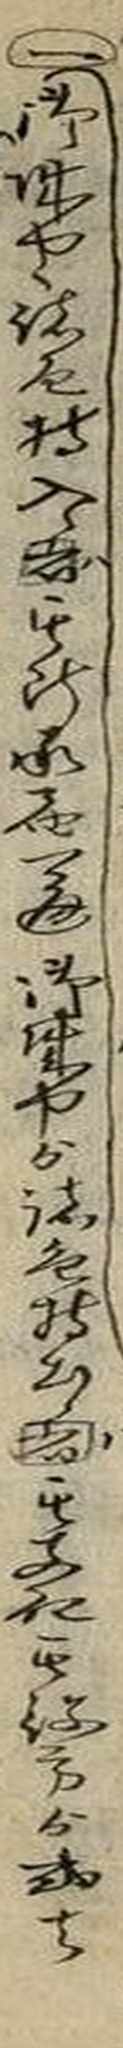一御城中へ諸色持入候ハ其断承届可通御城中ゟ諸色持出候ハハ其支配其役方ゟ或者
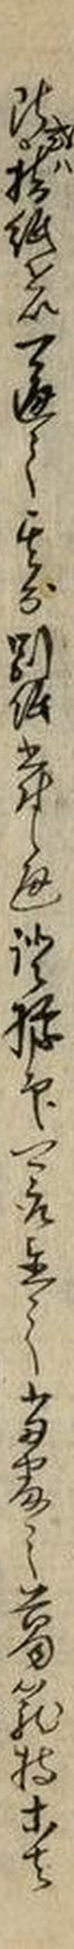断或ハ指紙を以可通之其分別紙書付之通証拠印可取置之当番之葛籠持等者
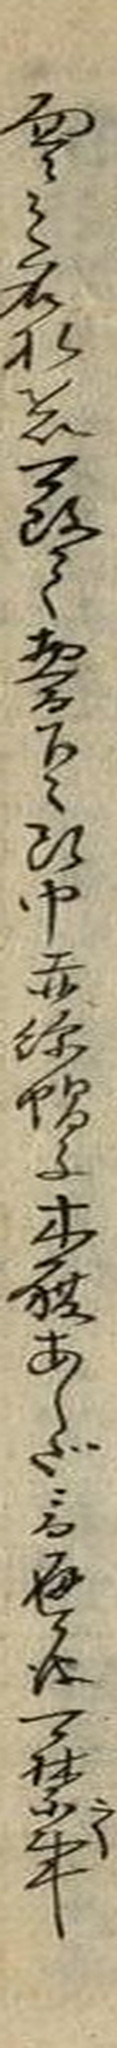面々之名札を以可改之惣而下々頭巾赤綿帽子木履あしだニ而通候儀可禁之事
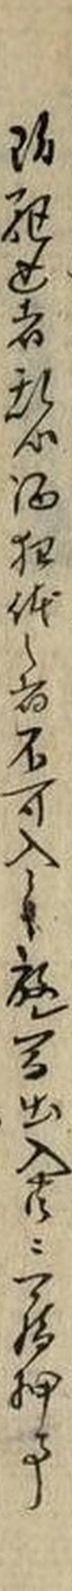附駆込者乱心酒狂体之者不可入候事放レ馬出入共ニ指押候事
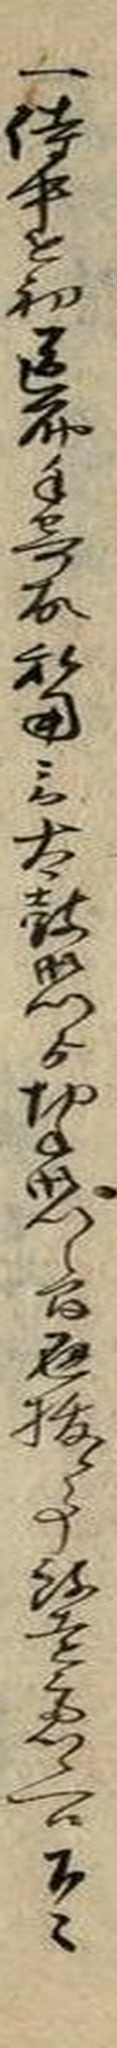一侍中を初道筋手寄故私用ニ而太鼓御門ゟ切手御門之間通抜候事致遠慮候へハ下々
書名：御門御櫓之部
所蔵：福井県文書館 Fukui Prefectural Archives
